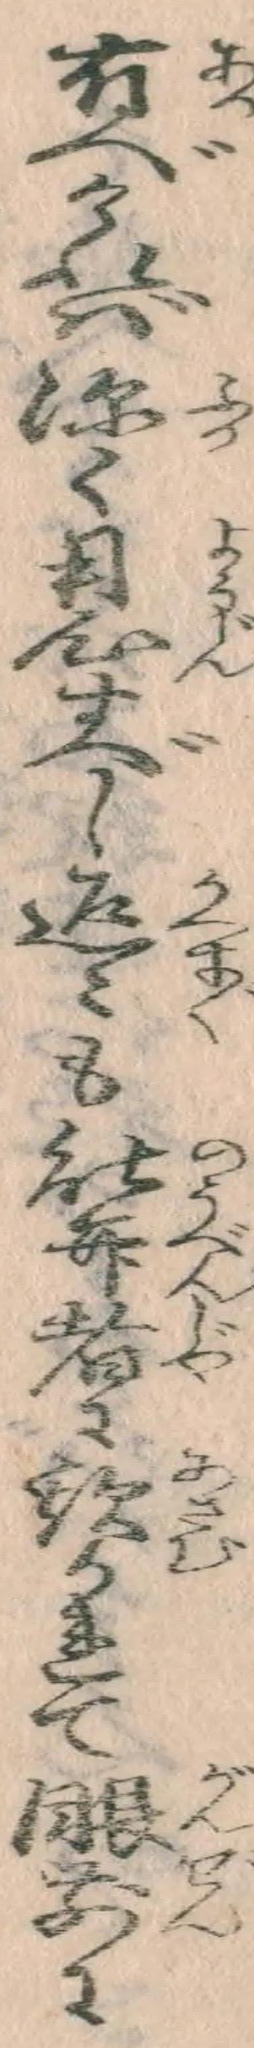有べければ深く用心すべし返々も能弁者に欺かれて眼前に
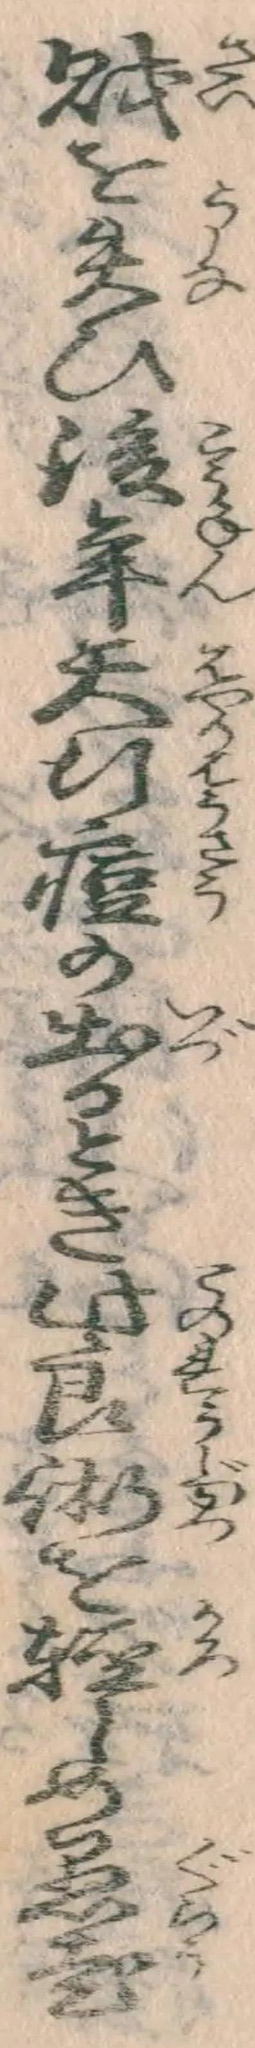財を失ひ後年天行痘の出るとき此良術を軽しめ愚老
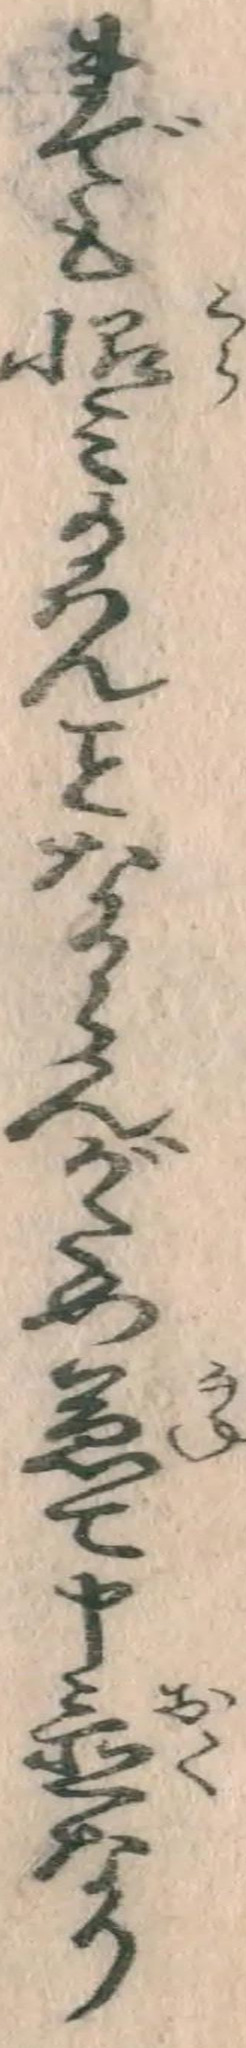までも恨み給はんことなからんがため兼て申置なり

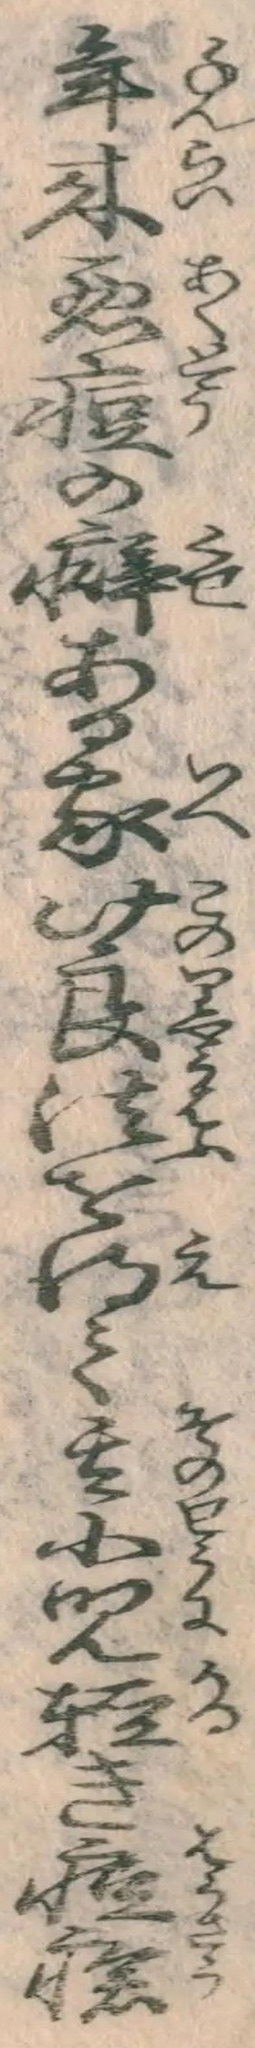年来悪痘の癖ある家此良法を得て其小児軽き痘瘡
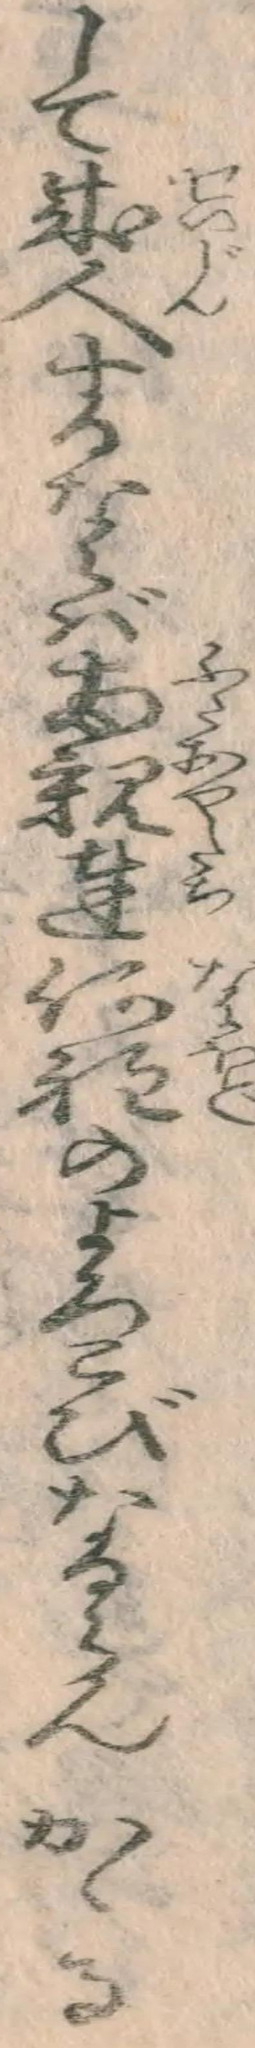して成人するならば両親達何程のよろこびなるらんかゝる
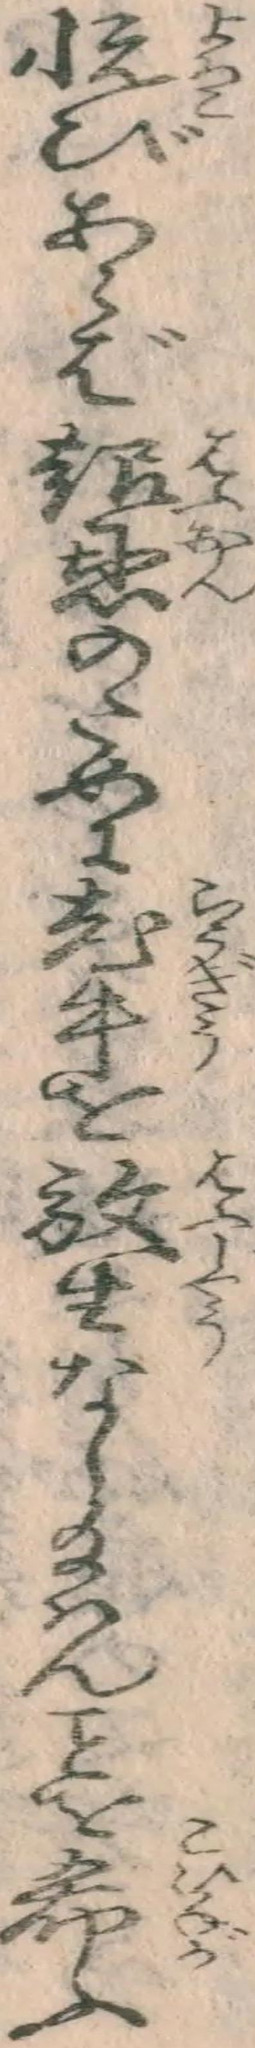悦びあらば報恩のために老牛を放生なし給はんことを希ふ
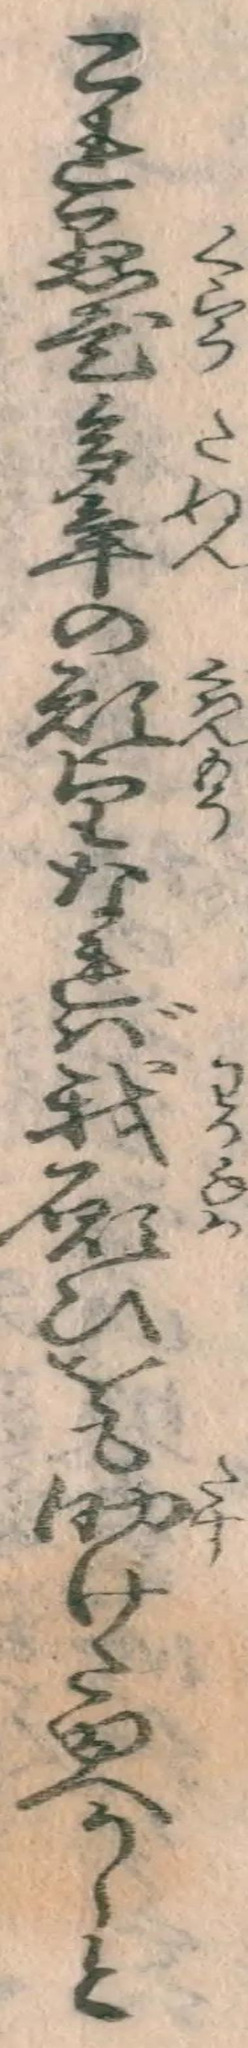これ愚老多年の願望なれば我願ひをも助けたまへかしと
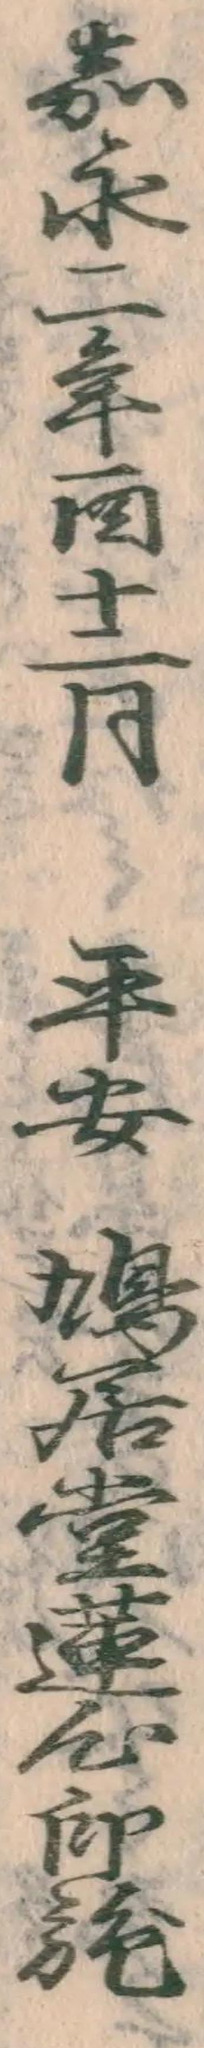嘉永二年酉十二月平安鳩居堂蓮心印施

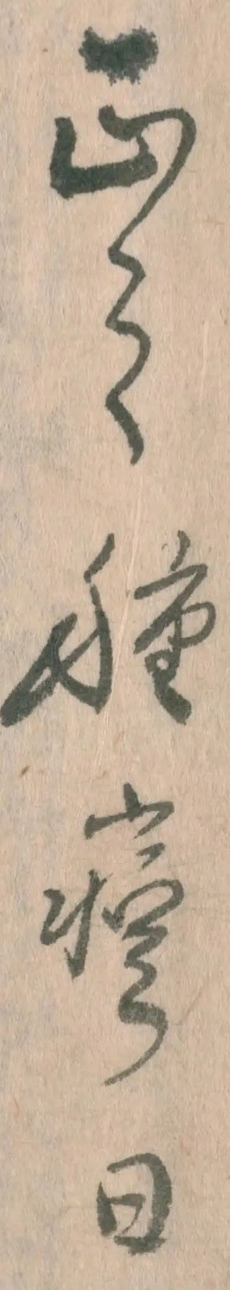正月種痘日
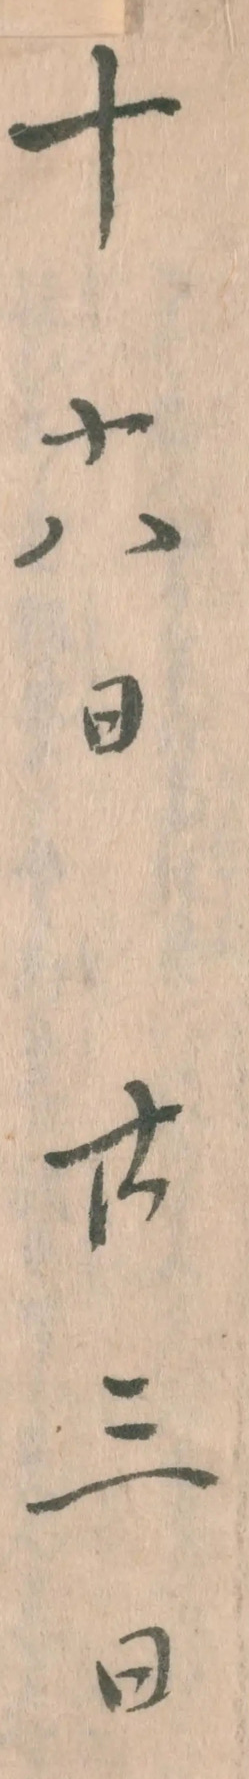十六日廿三日
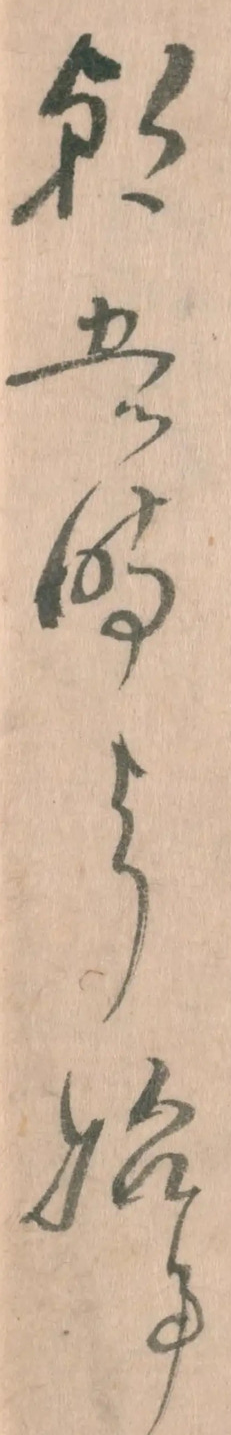朝五ッ時より始事
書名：痘瘡かるくする傳
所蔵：国立国会図書館 National Diet Library, JAPAN
